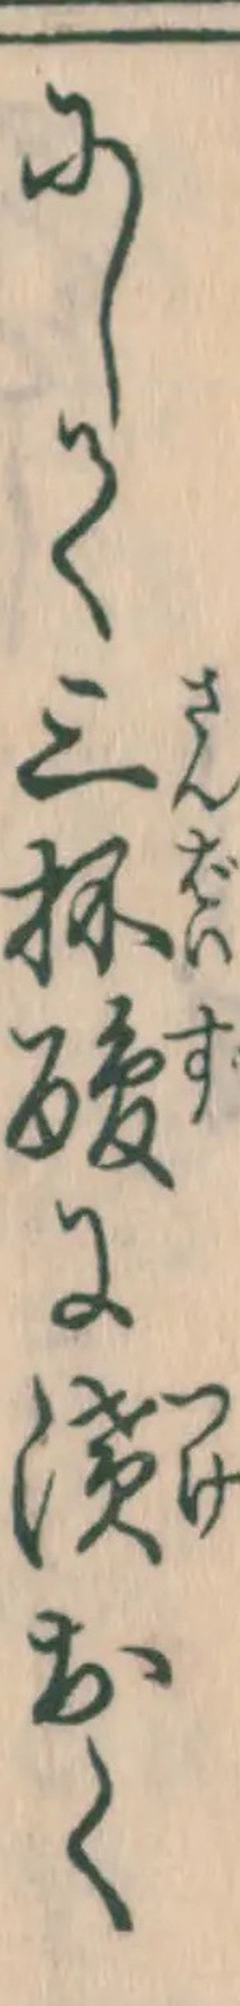にして三杯酸に漬おく
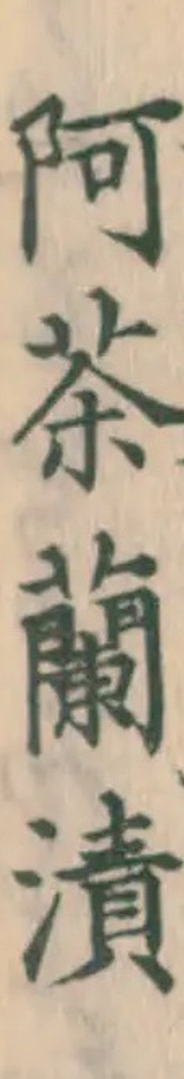阿茶蘭漬
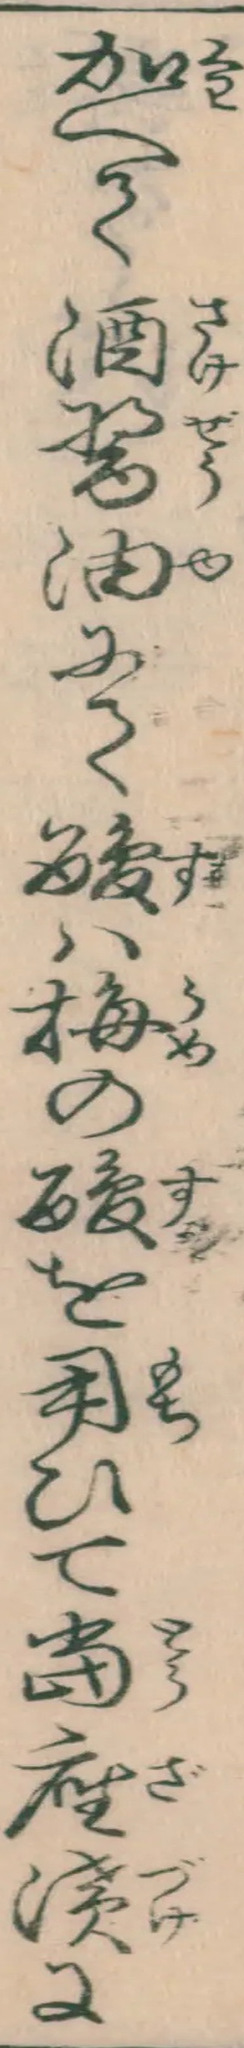加へて酒醤油にて酸は梅の酸を用ひて当座漬に
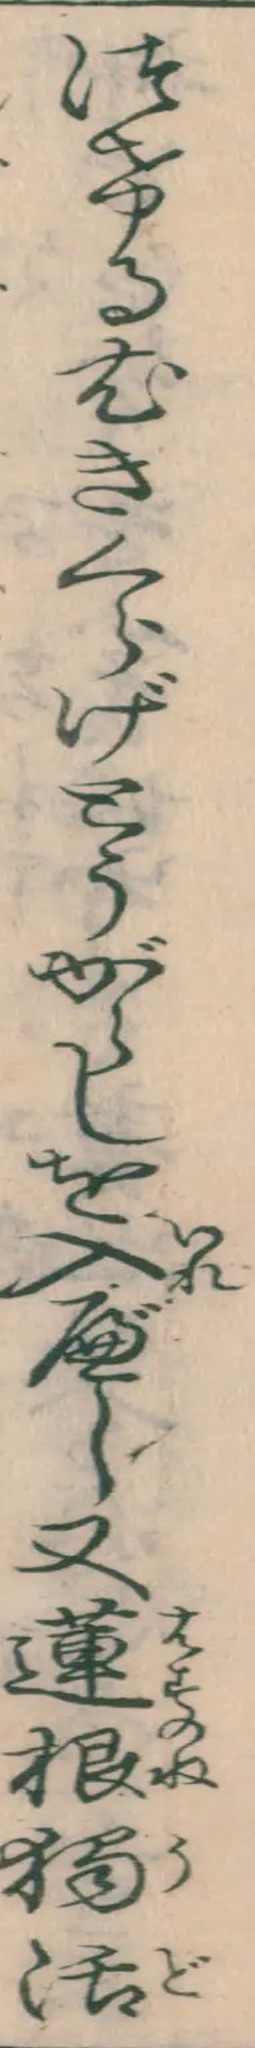つける尤きくらげとうがらしを入べし又蓮根独活
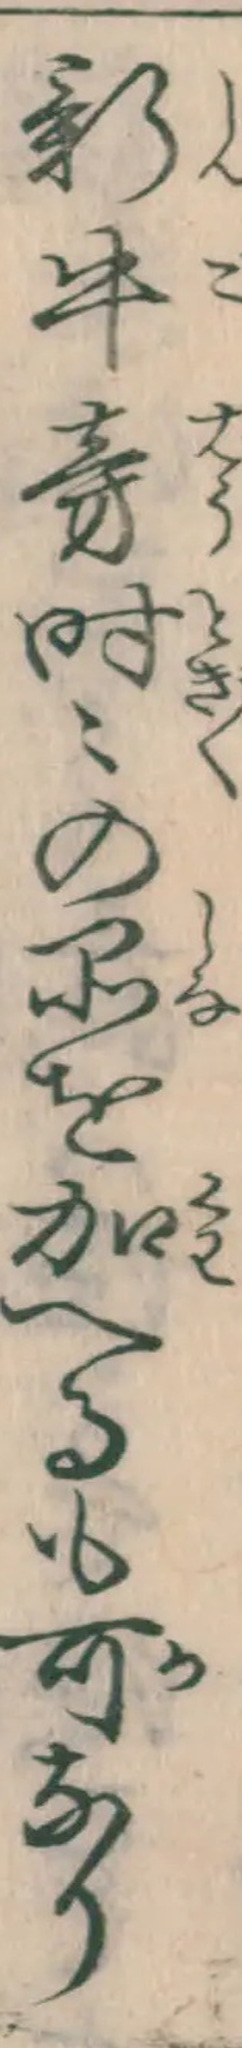新牛旁時々の品を加へるも可なり
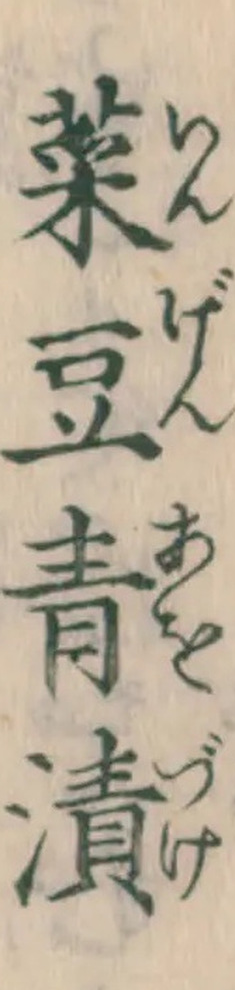菜豆青漬
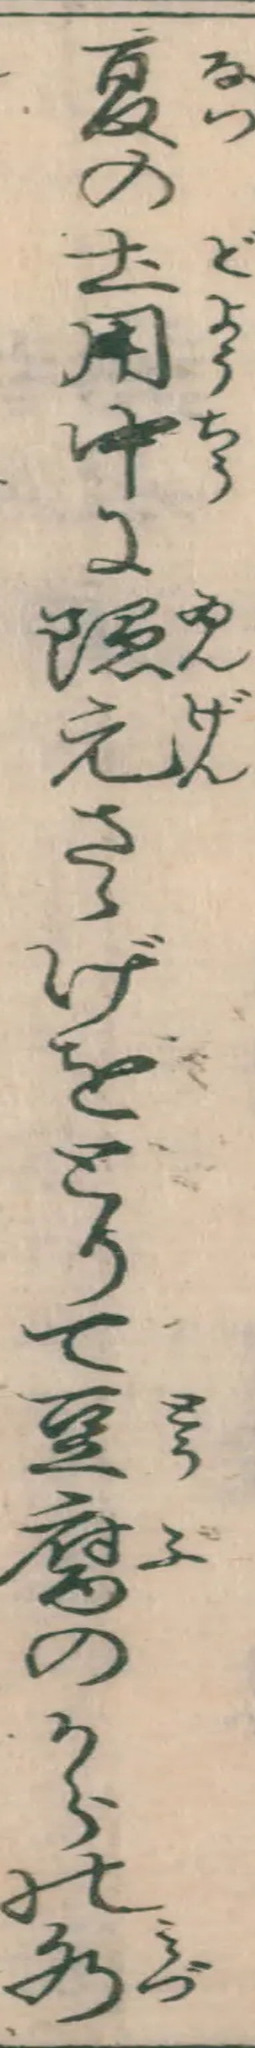夏の土用中に隠元さゝげをとりて豆腐のからの水
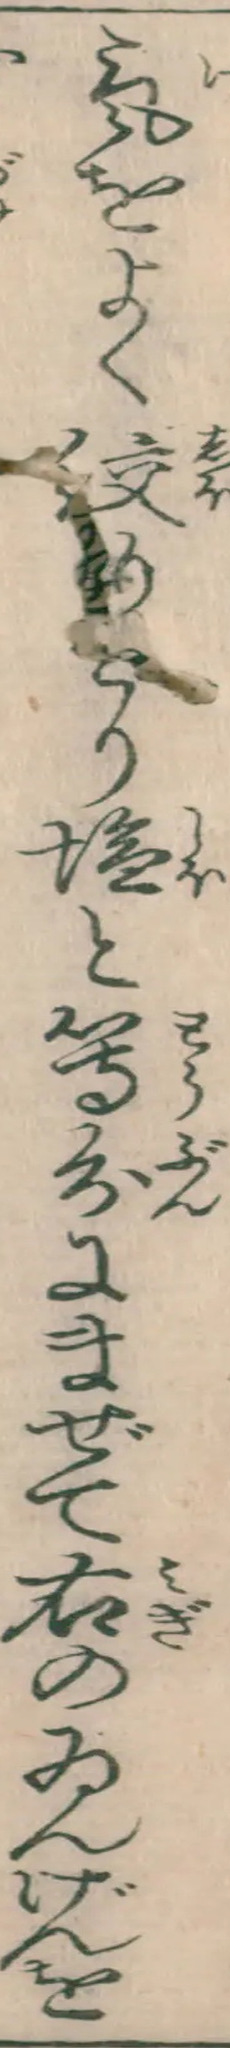気をよく絞りとり塩と等分にまぜて右のゐんげんを
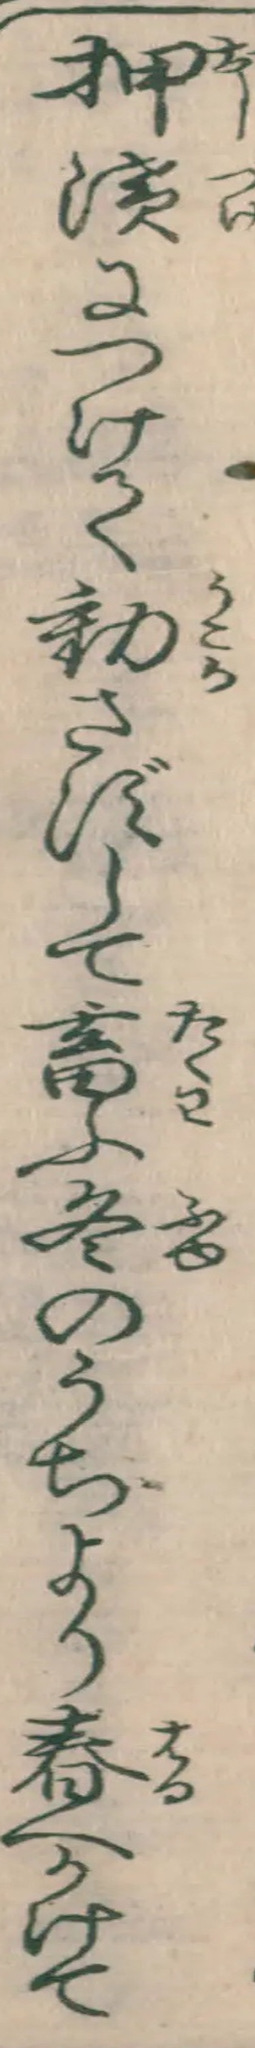押漬につけて動さずして畜ふ冬のうちより春へかけて

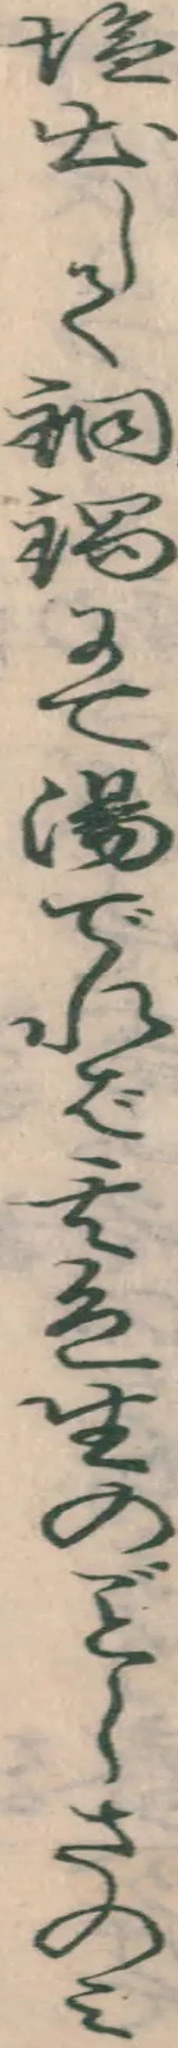塩出して銅鍋にて湯でれば其色生のごとしさのみ
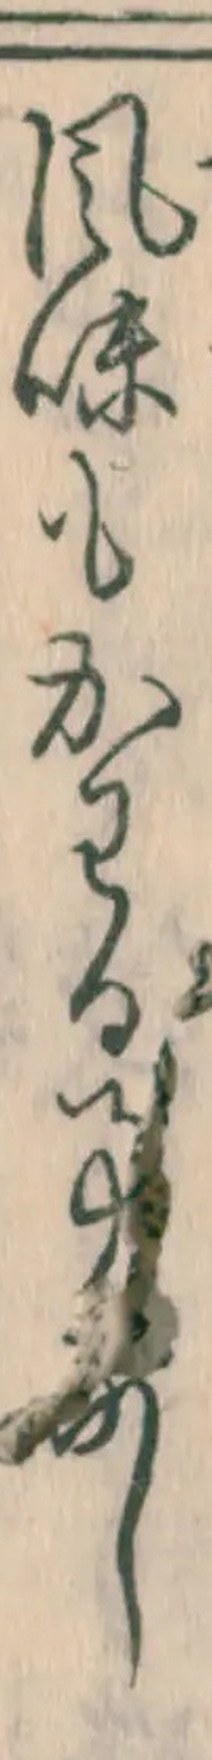風味もかわる事なし
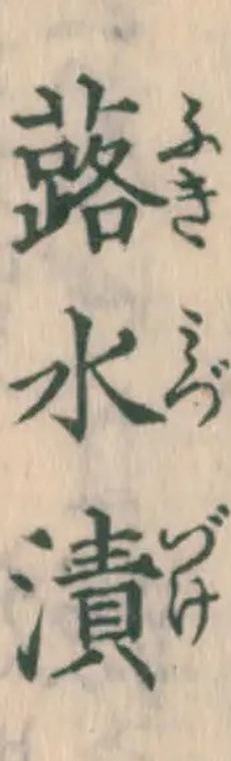蕗水漬
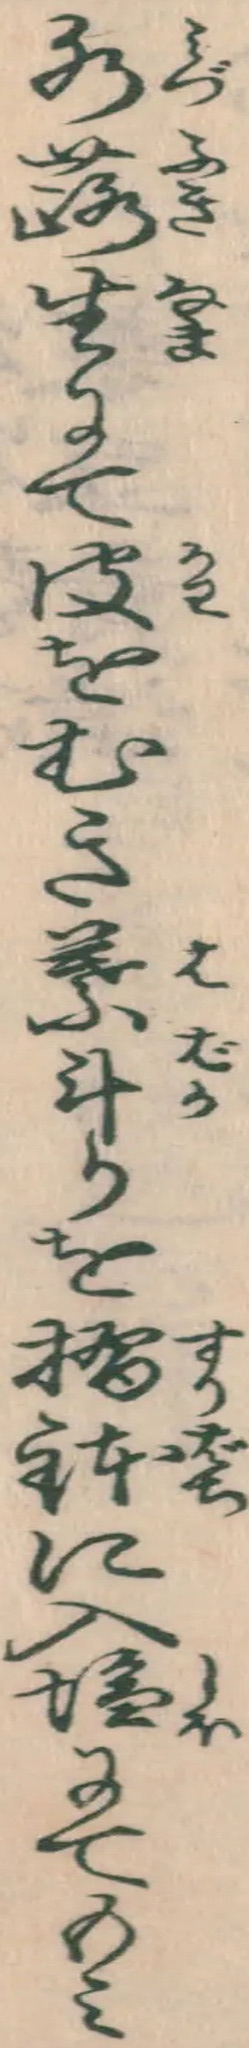水蕗生にて皮をむき葉斗りを摺鉢に入塩にてもみ
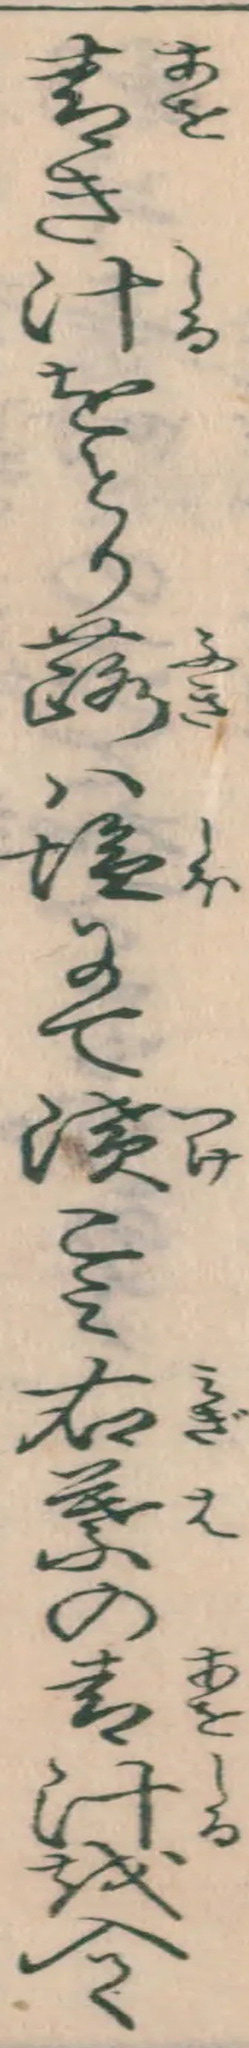青き汁をとり蕗は塩にて漬こみ右葉の青汁を入て
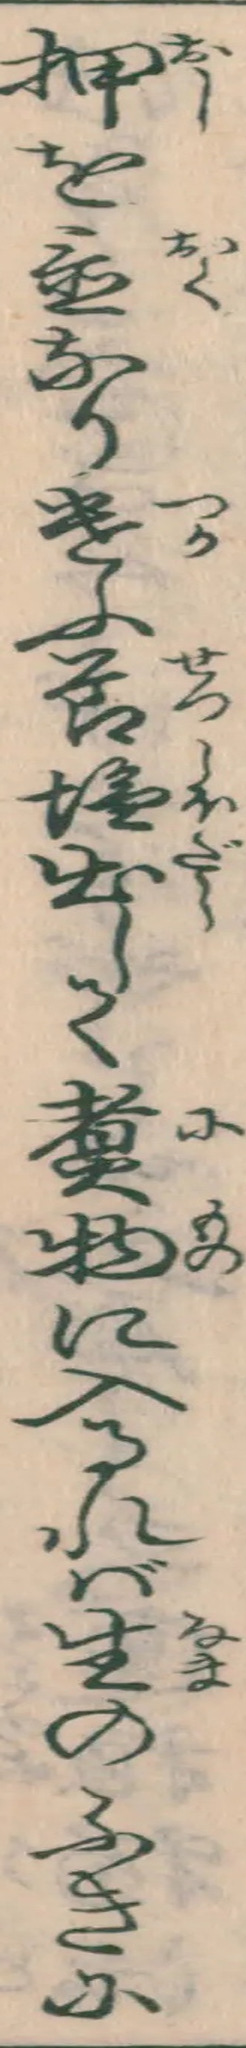押を置なり遣ふ節塩出して煮物に入るれば生のふきに
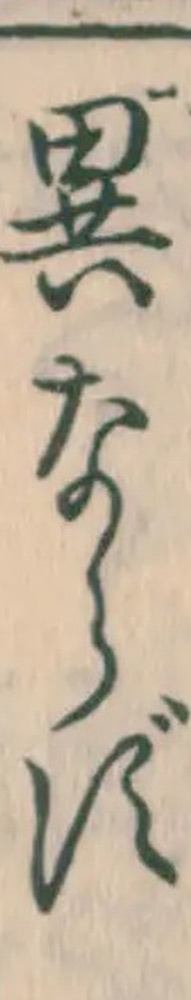異ならず
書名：四季漬物鹽嘉言
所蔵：国立国会図書館 National Diet Library, JAPAN
